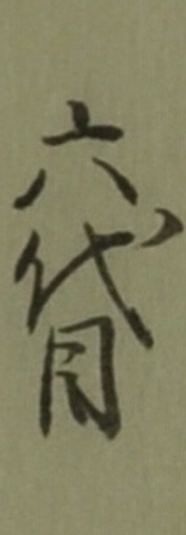六代目
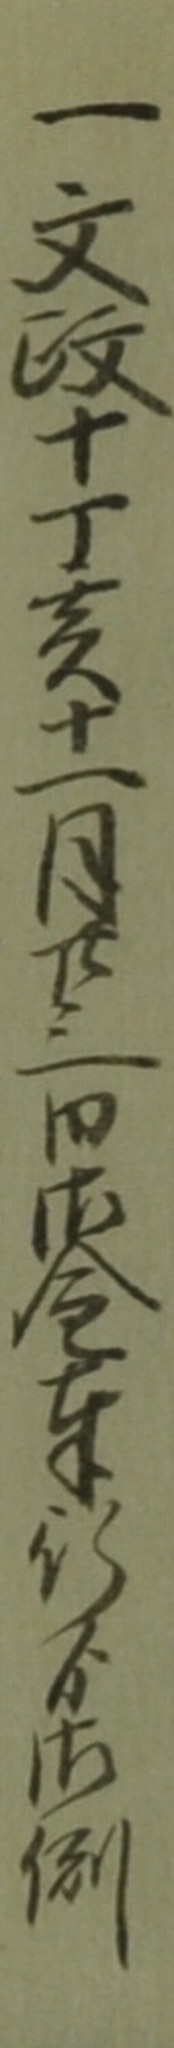一文政十丁亥十一月廿三日御金奉行ゟ御側
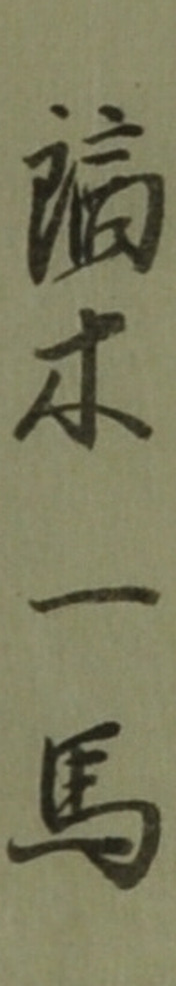鏑木一馬
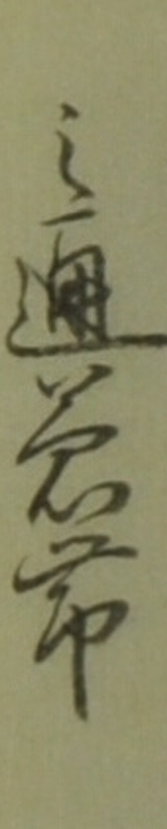之通兼帯

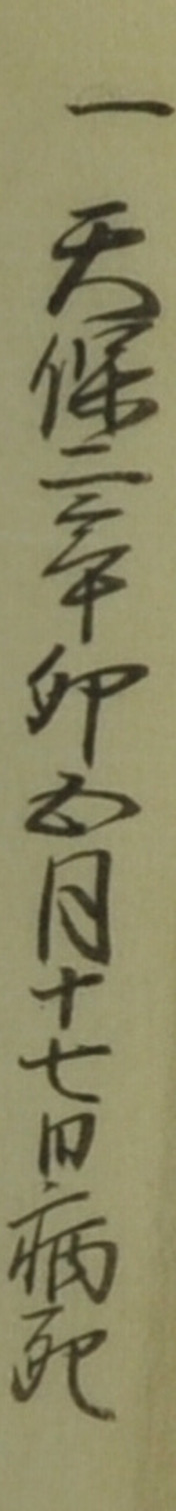一天保二辛卯五月十七日病死
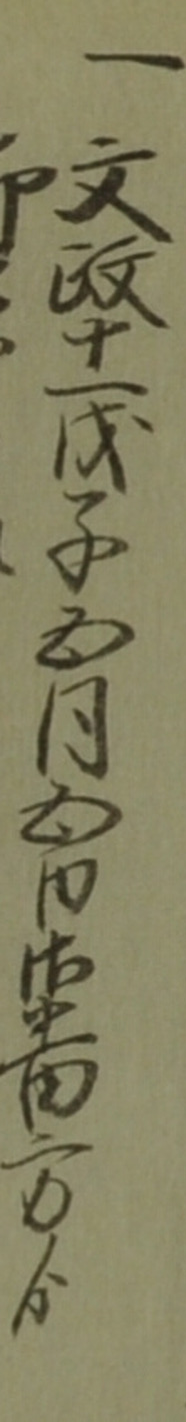一文政十一戌子五月五日御番方ゟ
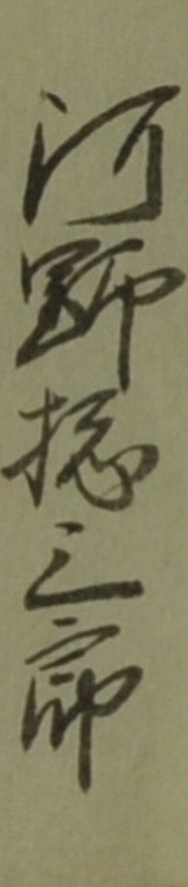河野捴三郎
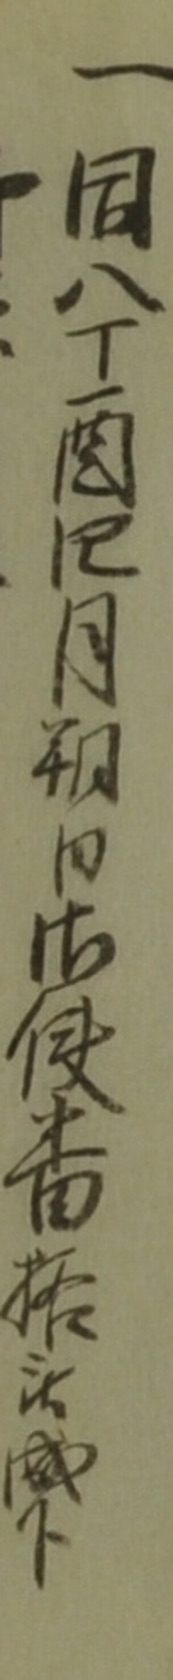一同八丁酉四月朔日御使番格被成下
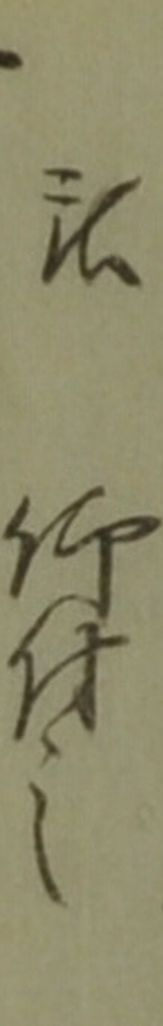被仰付之
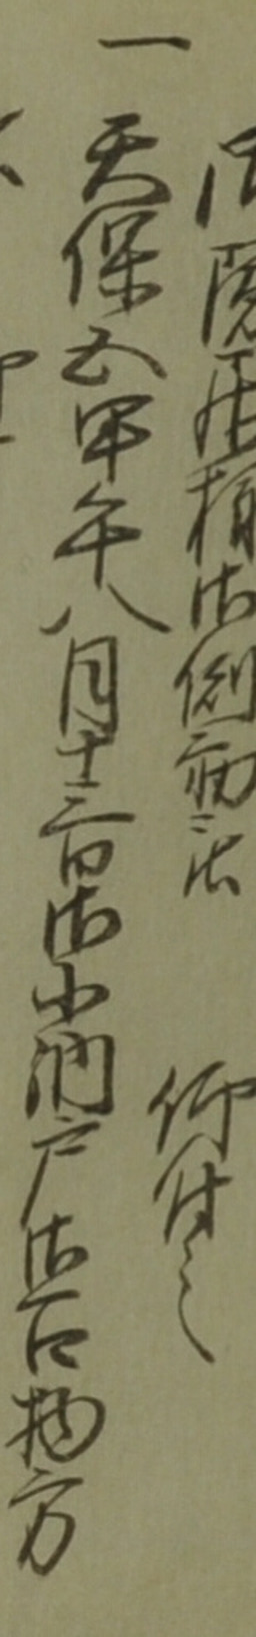一天保五甲午八月十三日御小納戸御召物方
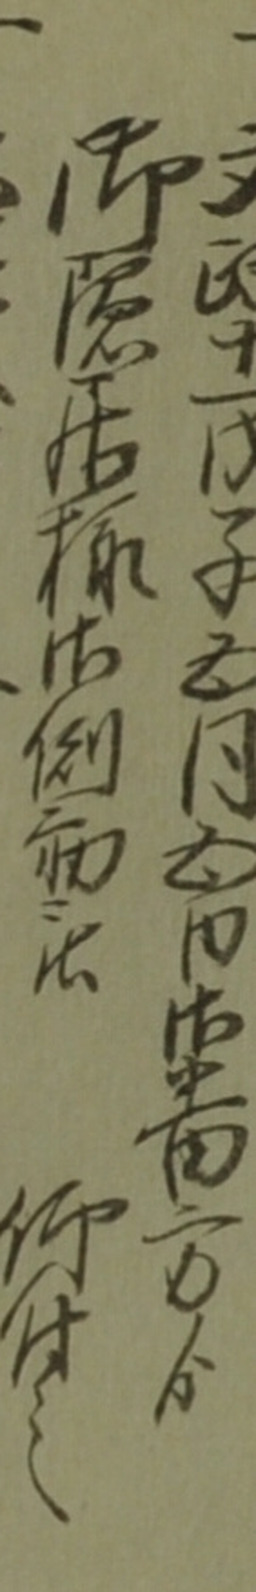御隠居様御側勤被仰付之
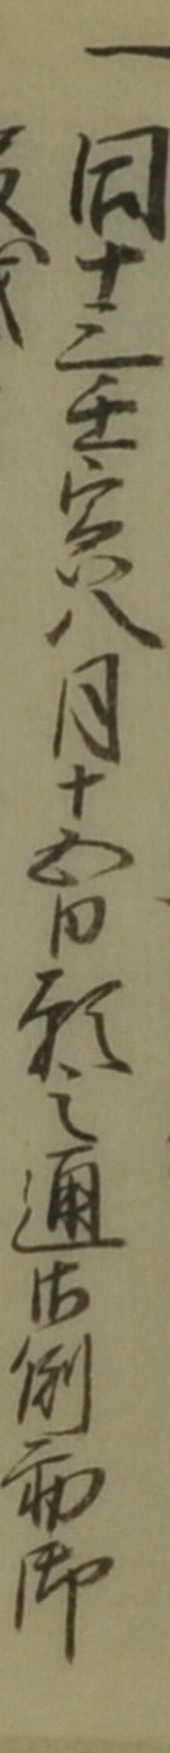一同十三壬寅八月十五日願之通御側勤御
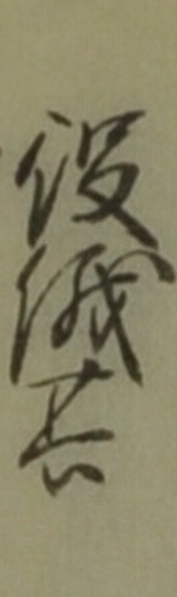役儀共
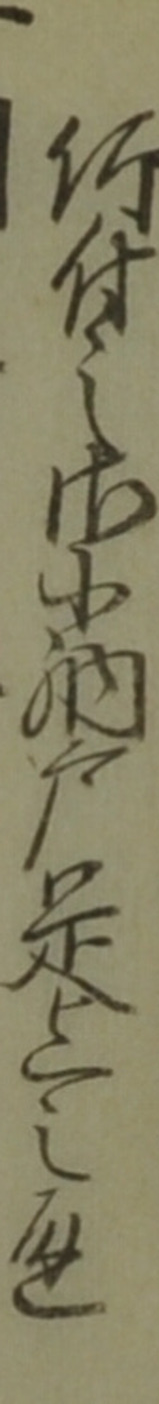仰付之御小納戸是迄之通
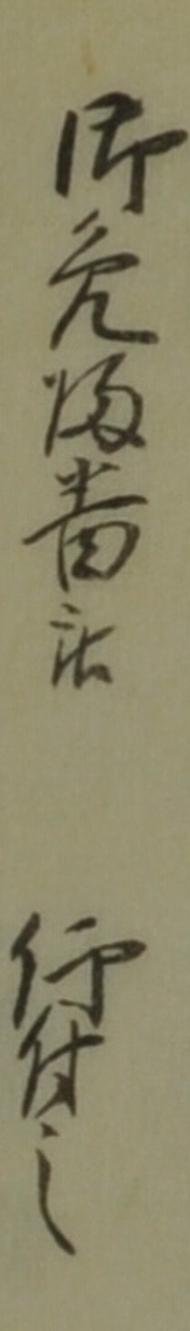御免帰番被仰付之
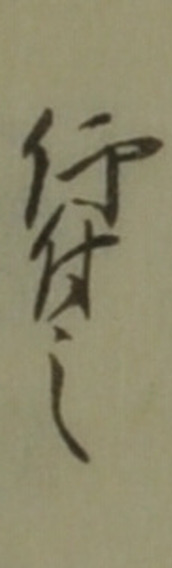仰付之
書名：諸御役代々録（五）
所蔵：伊那市立高遠町図書館・合同会社AMANE
